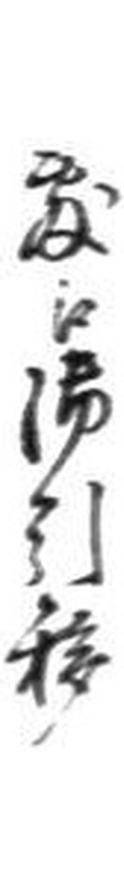敷江御引移

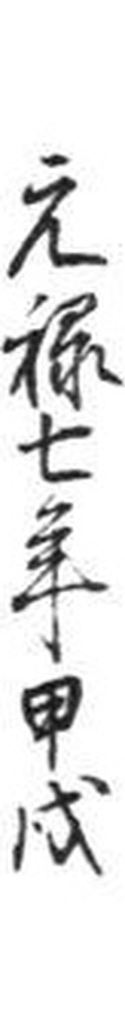元禄七年甲戌
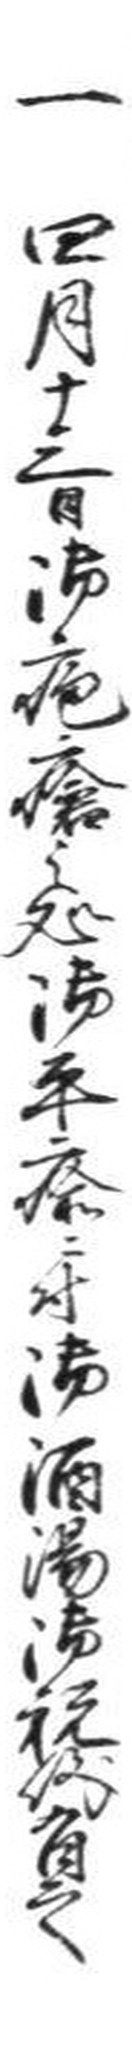一四月十三日御疱瘡之処御平癒ニ付御酒湯御祝儀有之
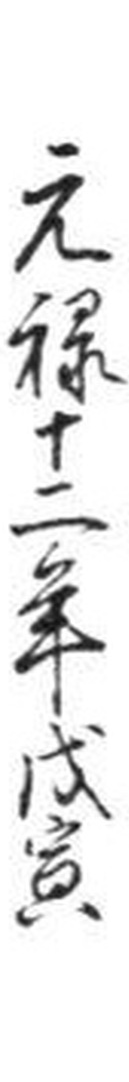元禄十二年戊寅
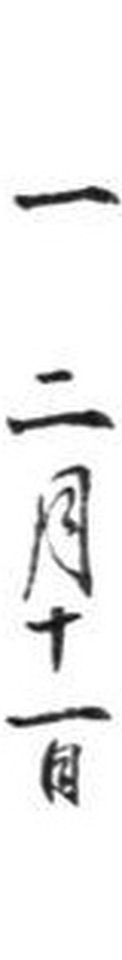一二月十一日
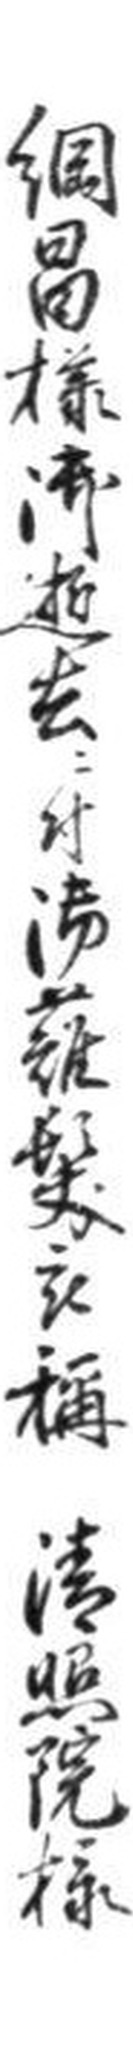綱昌様御逝去ニ付御薙髪被称清照院様
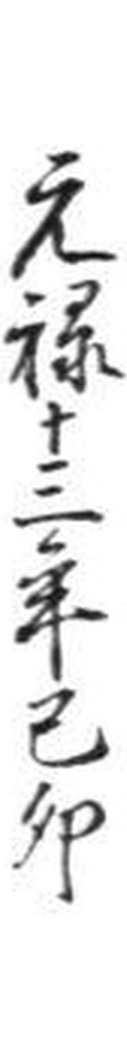元禄十三年己卯
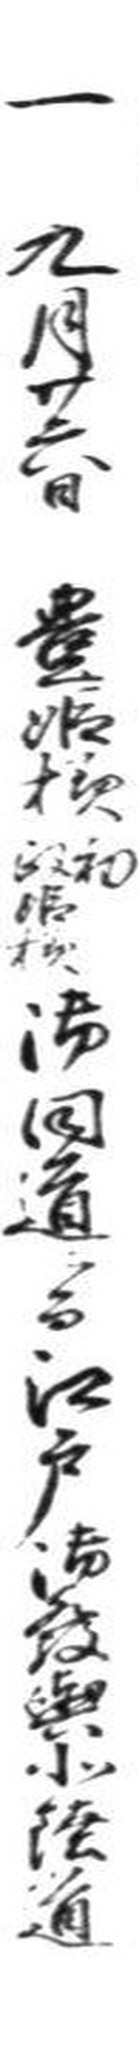一九月廿六日豊姫様初政姫様御同道ニ而江戸御発輿北陸道
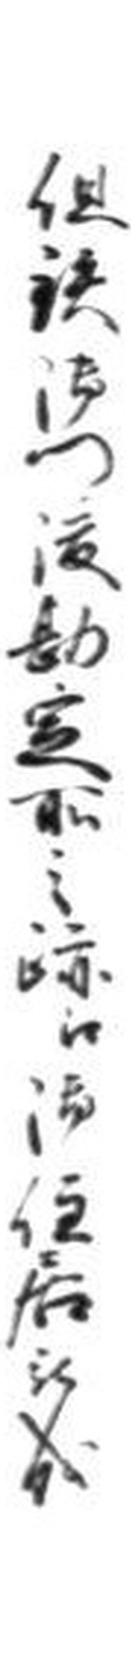但鉄御門後勘定所之跡江御住居被成
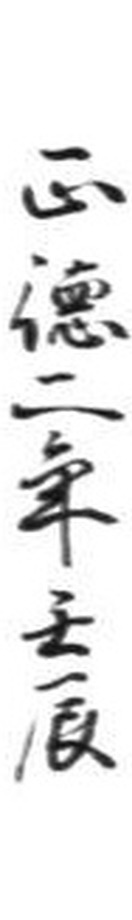正徳二年壬辰
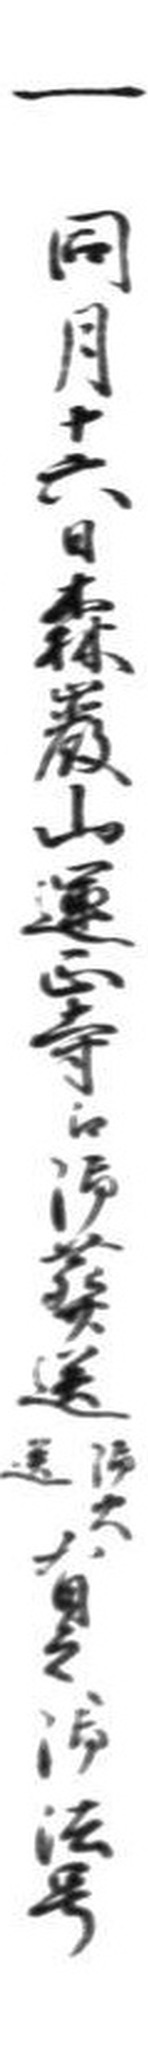一同月十六日森巌山運正寺江御葬送御大送有之御法号
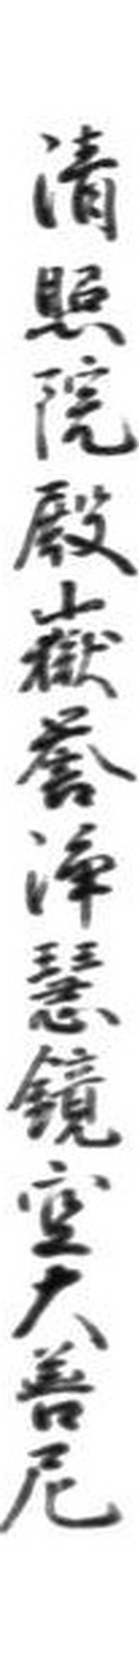清照院殿嶽誉浄慧鏡空大善尼

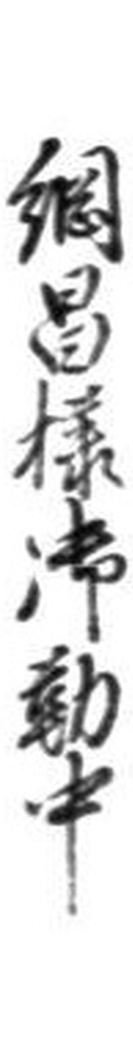綱昌様御勤中
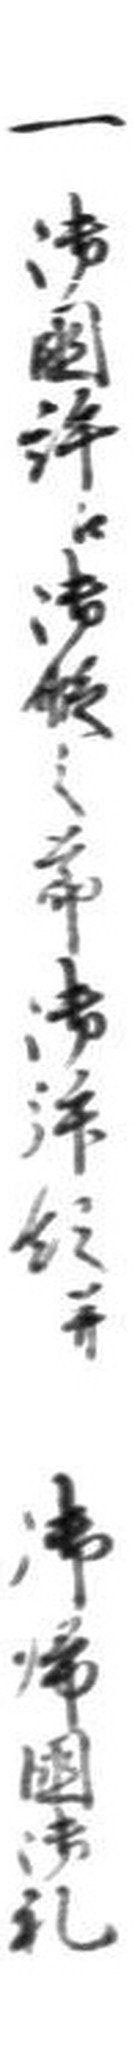一御国許江御暇之節御拝領并御帰国御礼
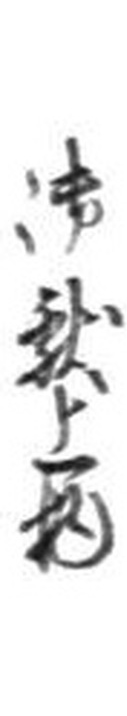御献上物
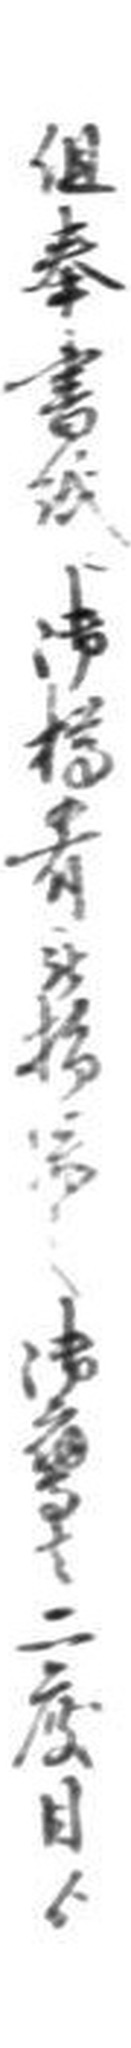但奉書紙御樽肴被指添之御鷹者二度目ゟ
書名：家譜 十五 綱昌公 従天和元年到元禄十二年
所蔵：福井県文書館 Fukui Prefectural Archives
